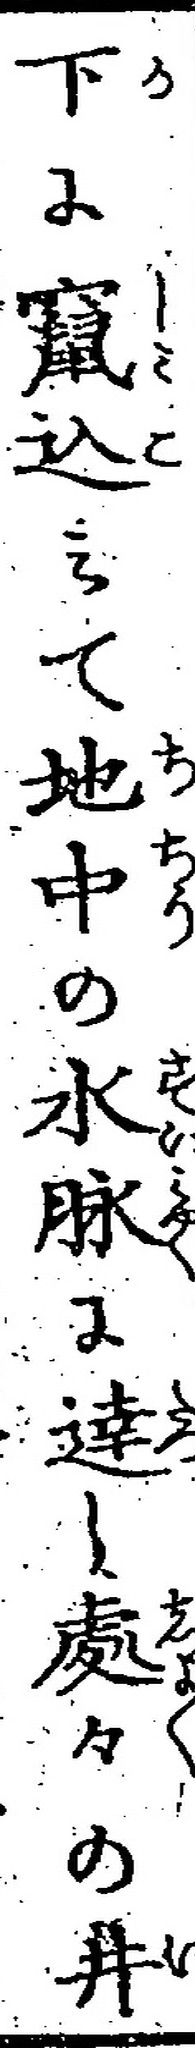下に竄込みて地中の水脈に達し処々の井
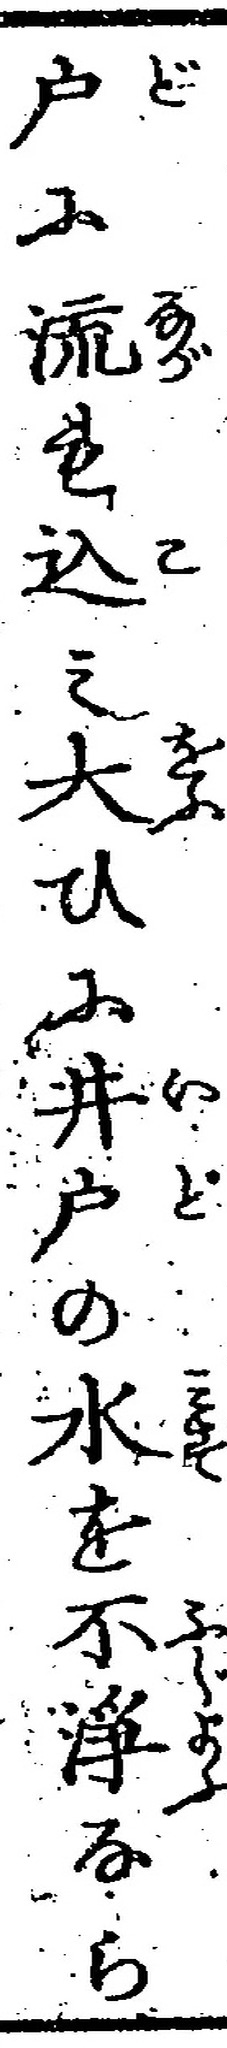戸に流れ込み大ひに井戸の水を不浄なら
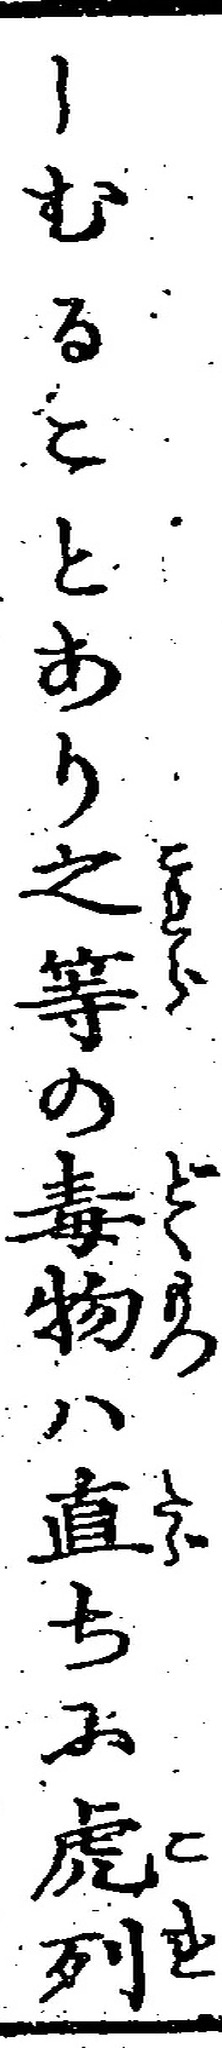しむることあり之等の毒物は直ちに虎列
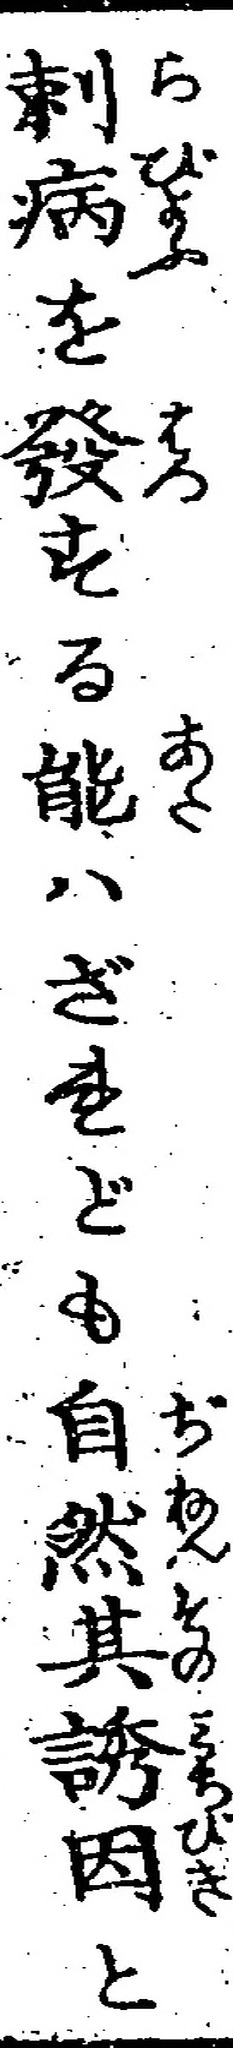刺病を発する能はざれども自然其誘因と
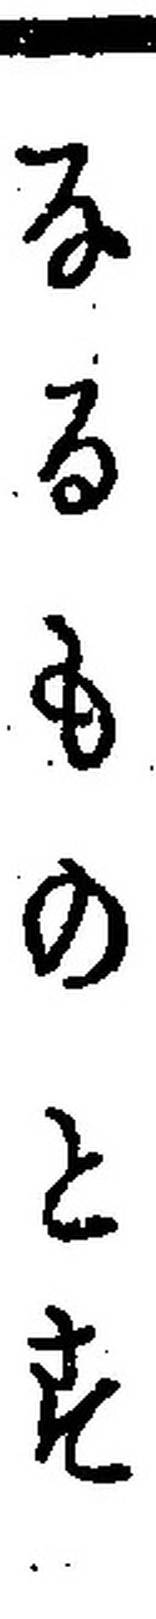なるものとす
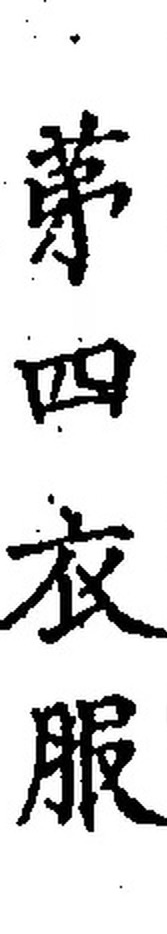第四衣服
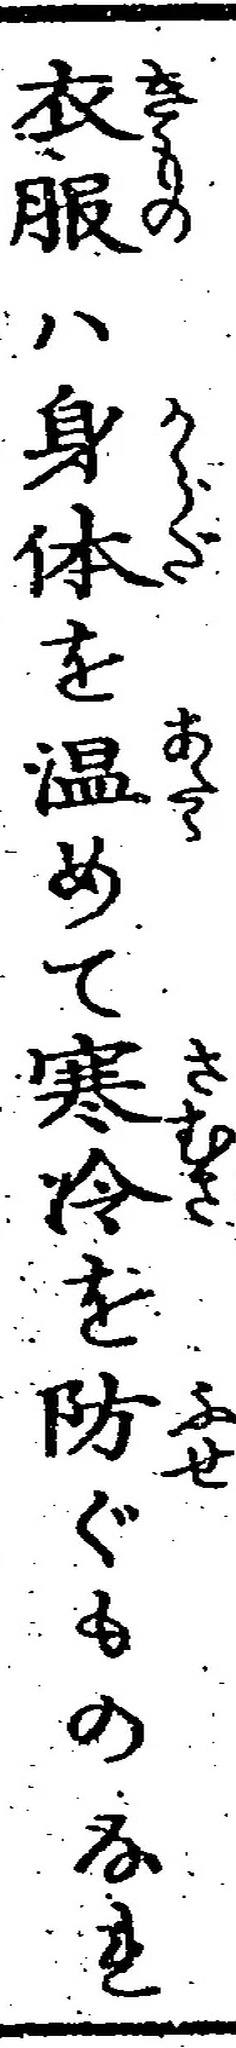衣服は身体を温めて寒冷を防ぐものなれ
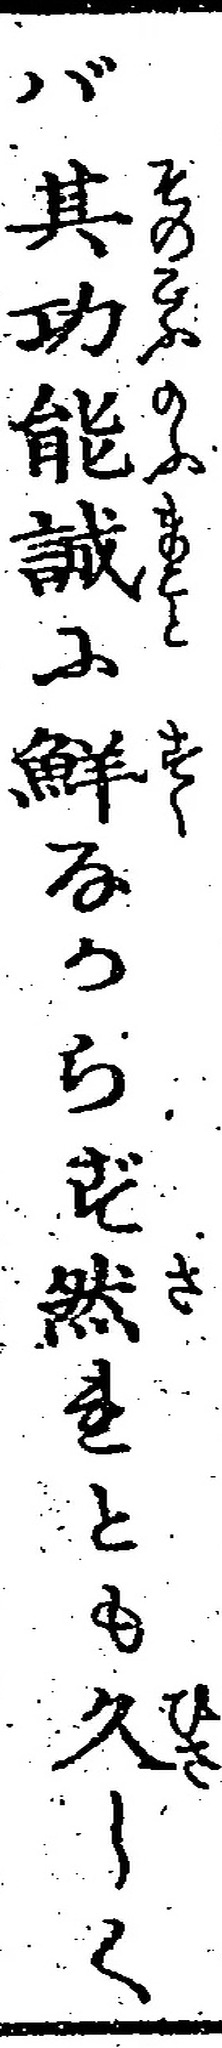ば其功能誠に鮮なからず然れとも久しく
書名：コレラ予防命乃後見
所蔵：国立国会図書館 National Diet Library, JAPAN
